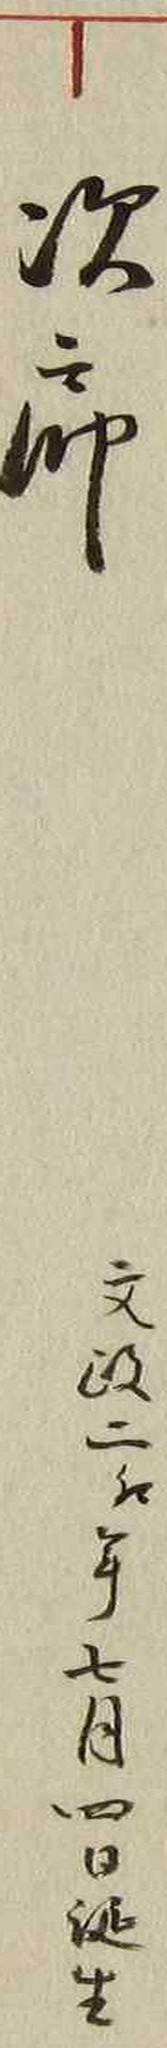次郎文政二卯年七月四日誕生
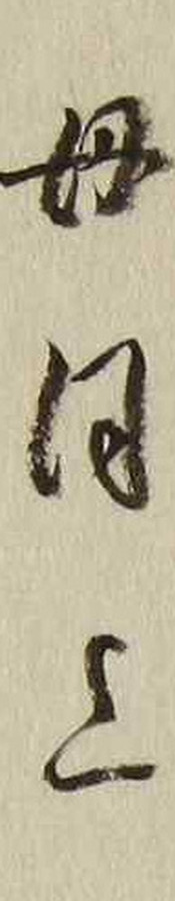母同上

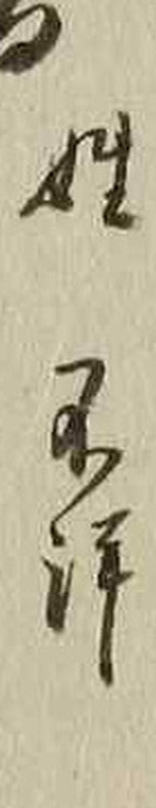父不詳
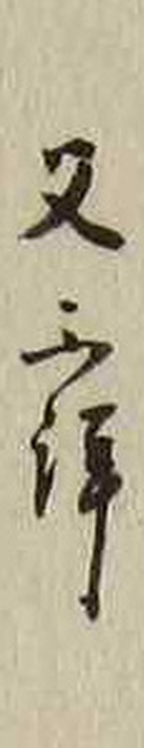父不詳
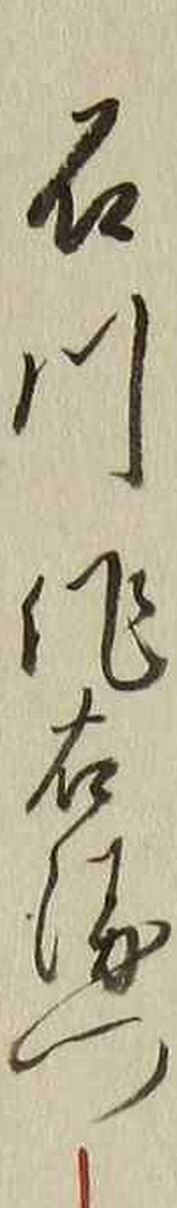石川作右衛門
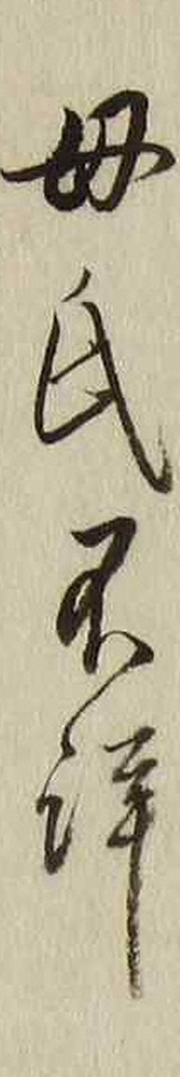母氏不詳
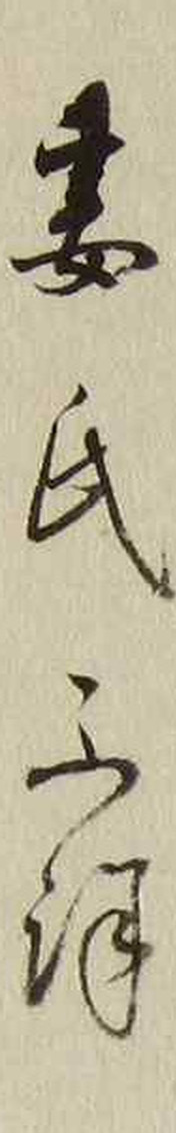妻氏不詳
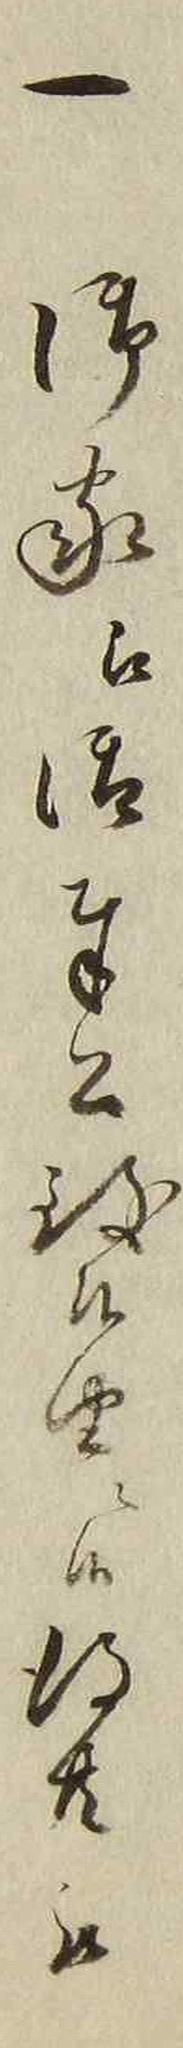一御家江御奉公致候由ニ候得共被

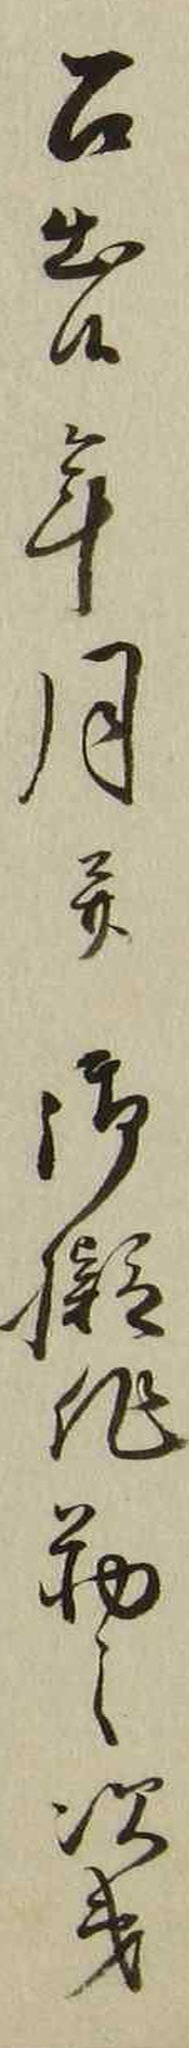召出候年月幷御擬作勤之次第
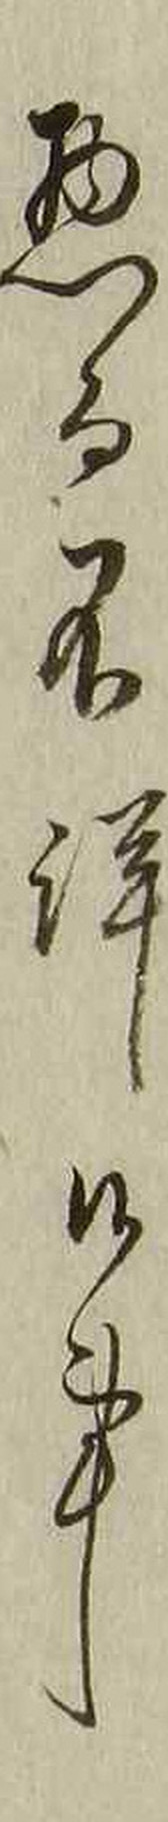惣而不詳候事
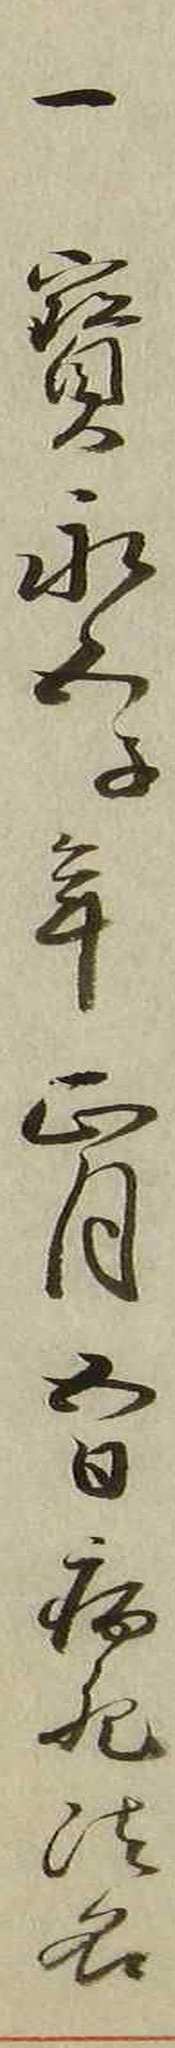一宝永五子年正月五日病死法名
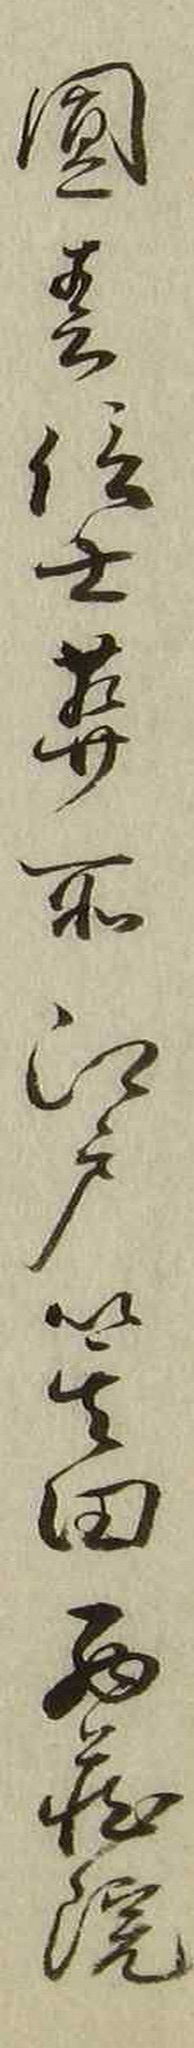圓春信士葬所江戸箕田西蔵院
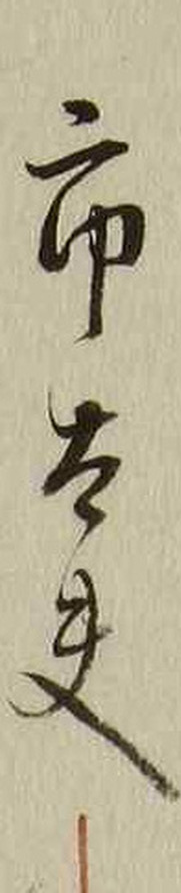市太夫
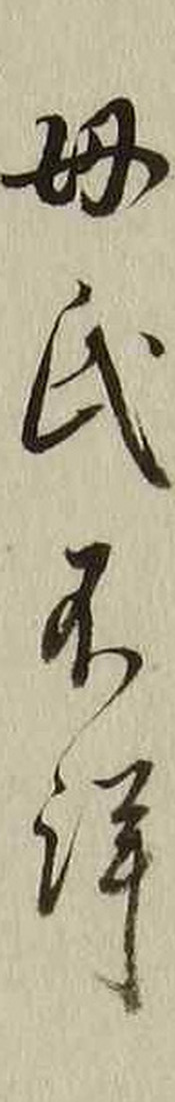母氏不詳
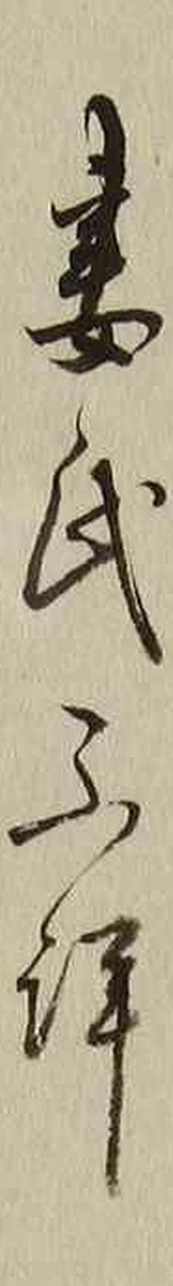妻氏不詳
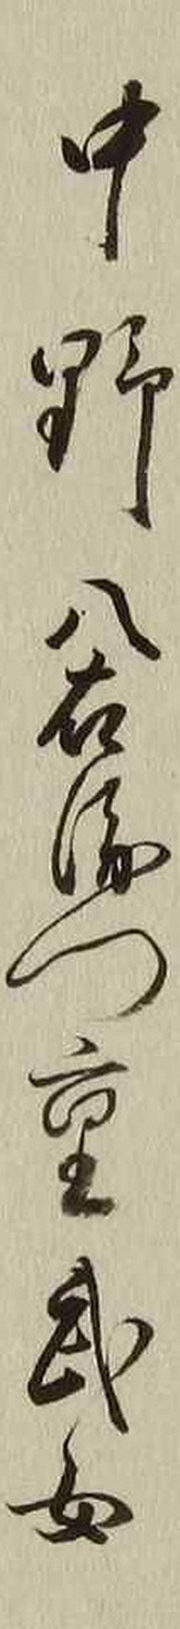中野八右衛門重武女
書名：諸士系譜　巻之32　い之部32
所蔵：会津若松市立会津図書館
